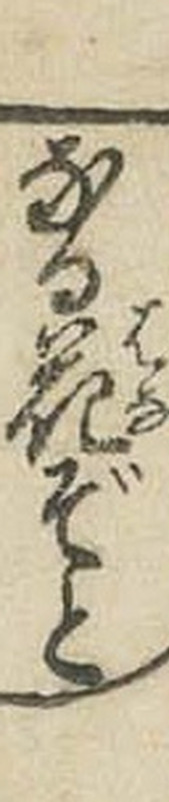なる花ぞと
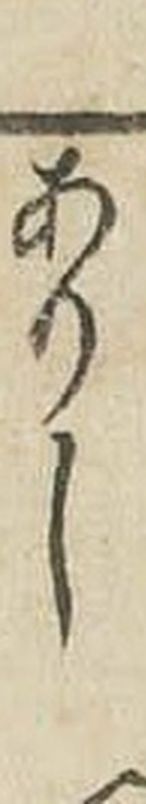ありし
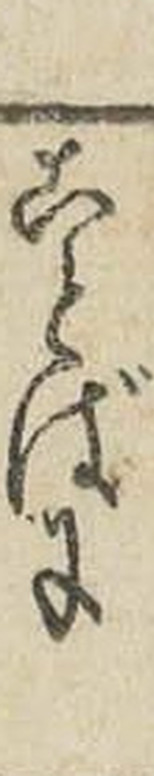ことばに
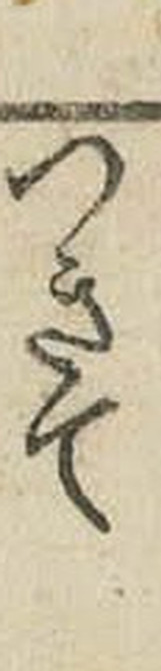つきて
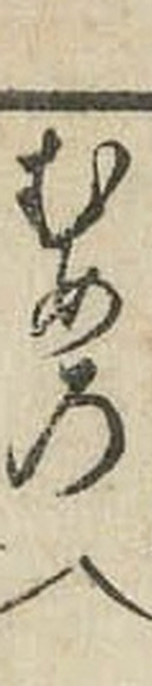むめの
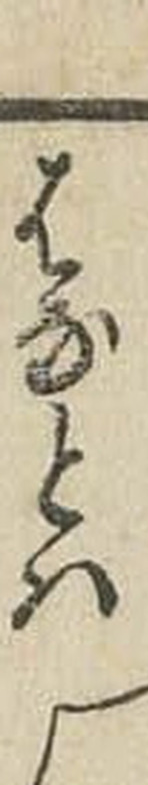はなとは
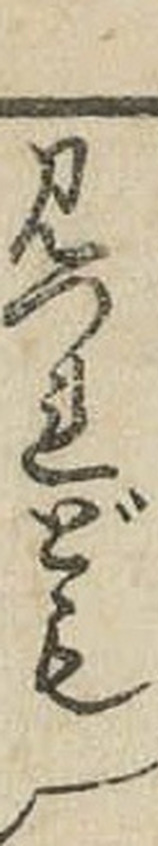見つれども
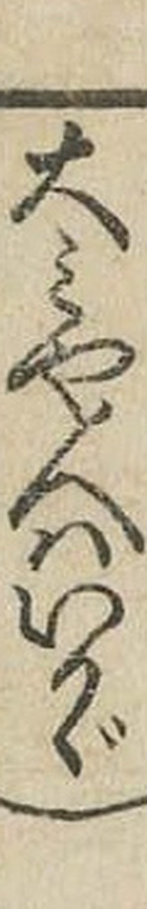大みや人はいかゞ
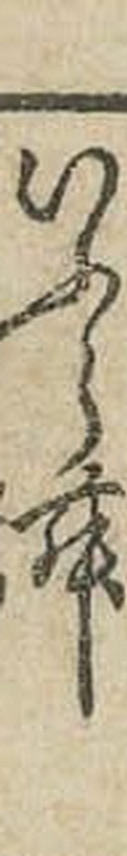いふらむ
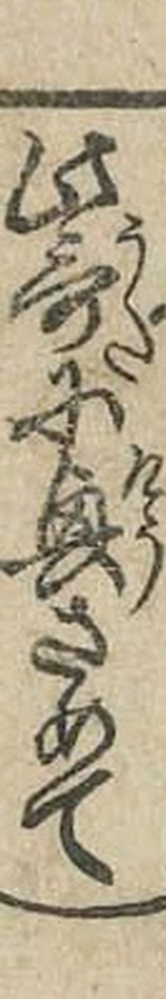此哥に興さめて
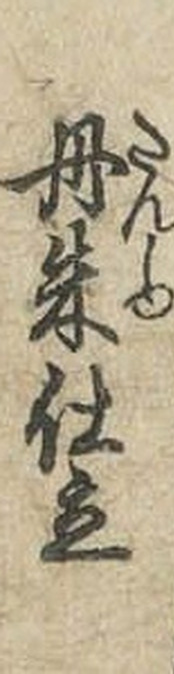丹朱仕立

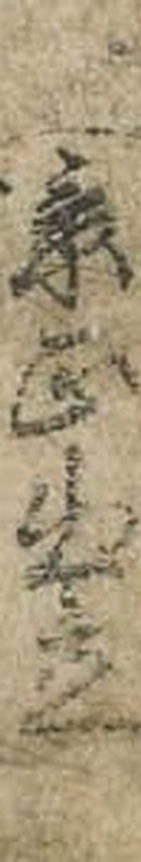景正出立
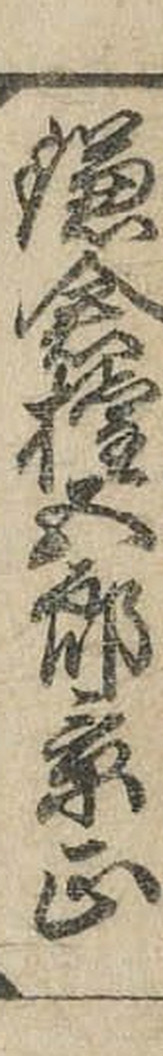鎌倉権五郎景正
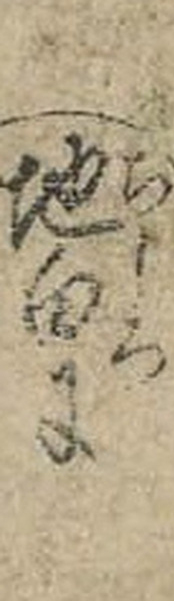地白に
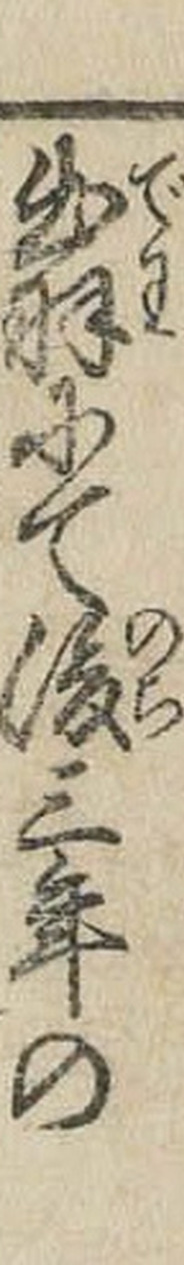出羽にて後三年の
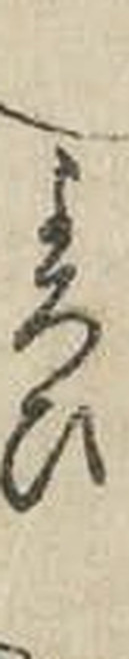よろひ
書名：絵本写宝袋 9巻 3之巻
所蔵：東京学芸大学教育コンテンツアーカイブ
